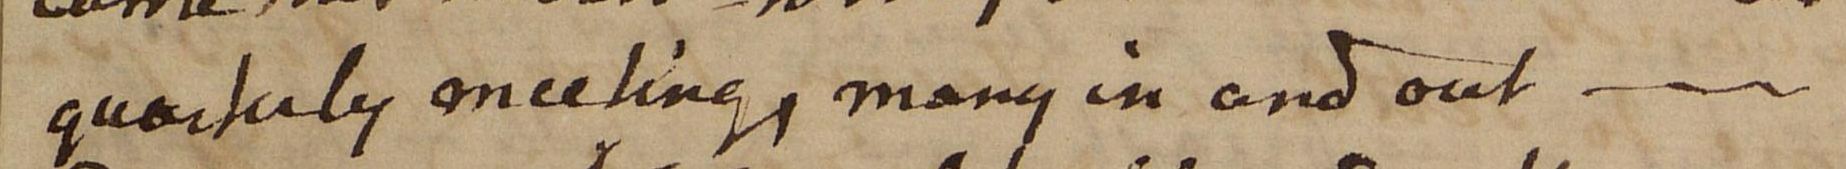quarterly meeting, many in and out-
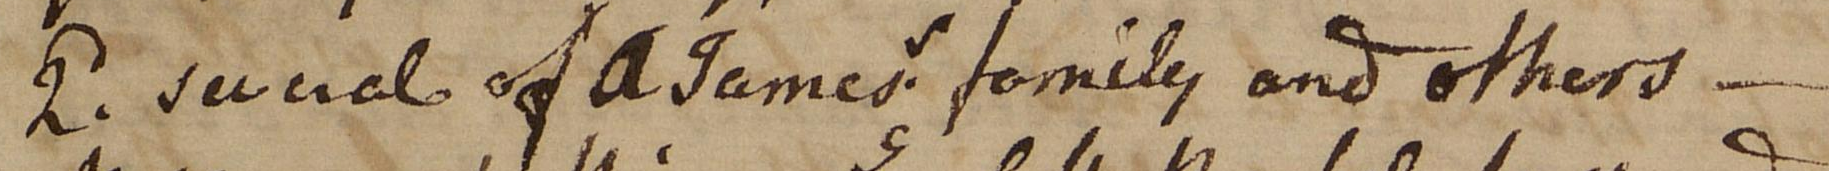2^d. several of A James^s. family and others-
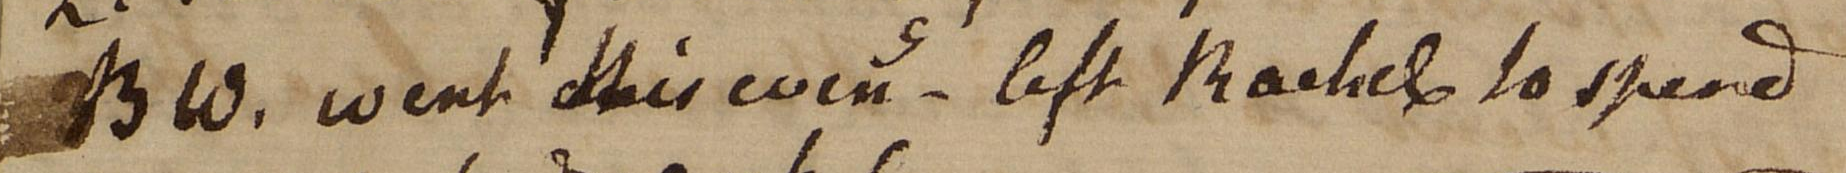BW, went this even^g- left Rachel to spend
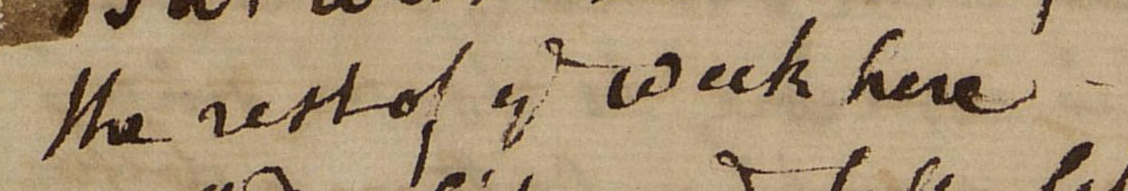the rest of y^e week here-
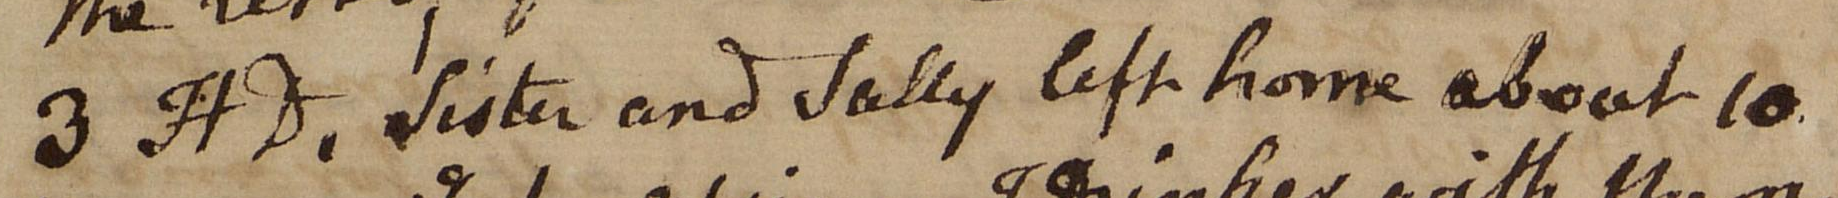3 HD. Sister and Sally left home about 10
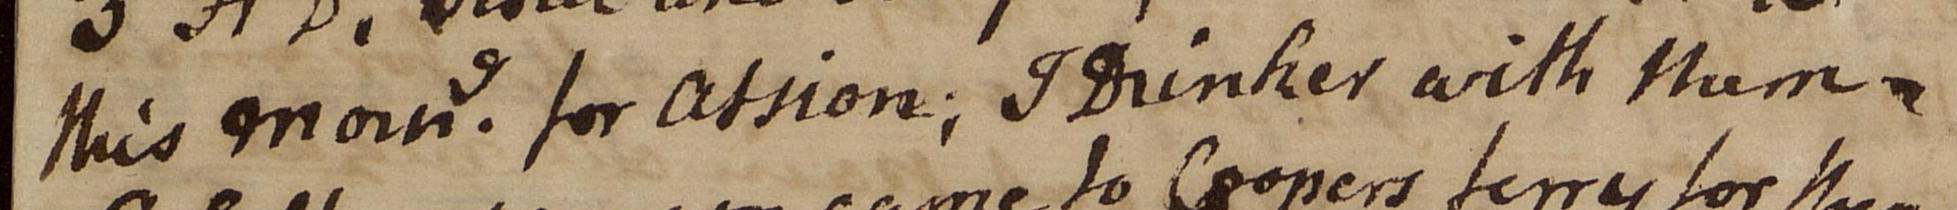this morn^g. for Atsion; I Drinker with them-
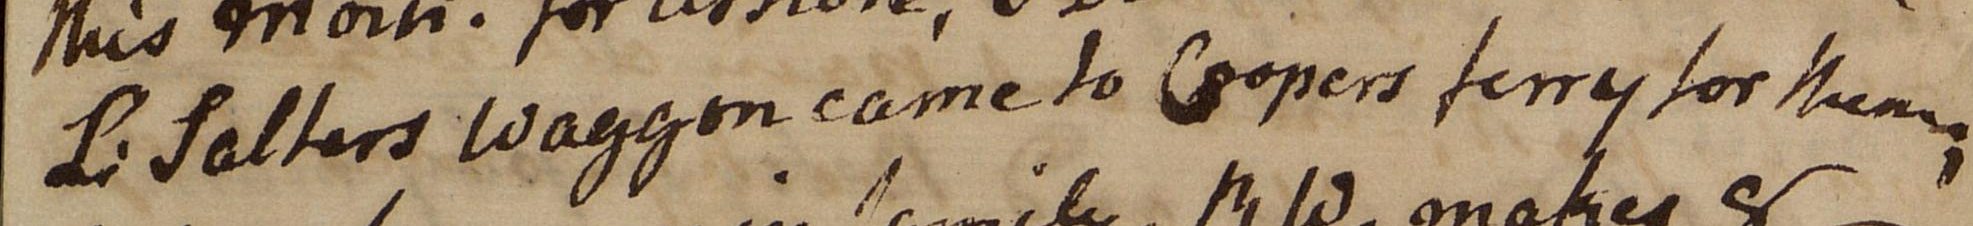L. Salters waggon came to Coopers ferry for them;
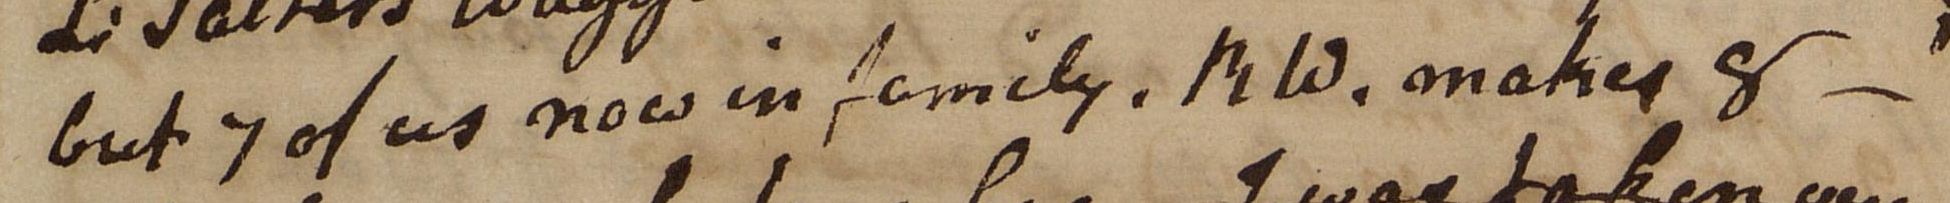but 7 of as now in family, RW, makes 8-
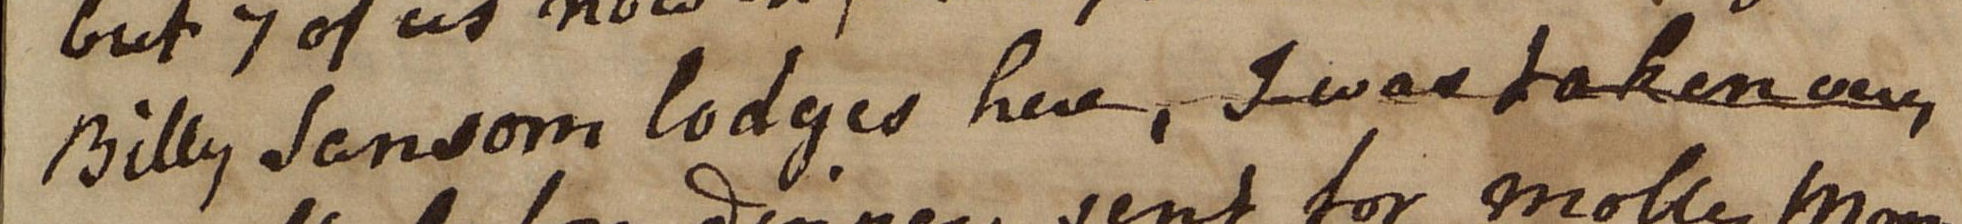Billy Sansom lodges here, I was taken very
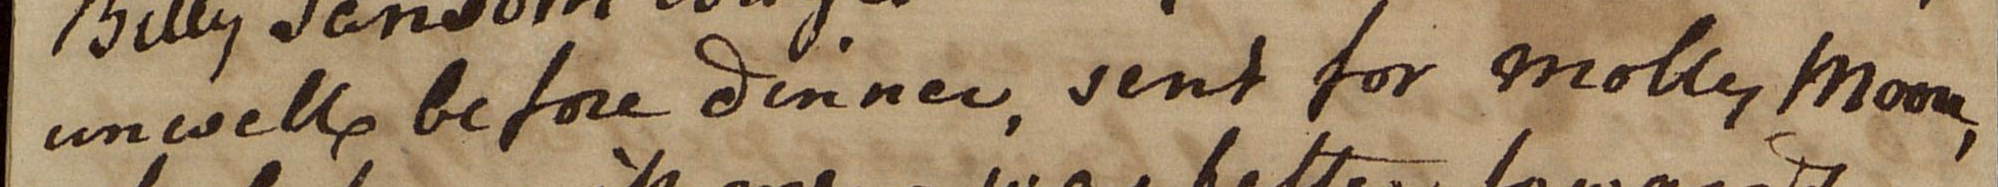unwell before dinner, sent for Molly Moore,
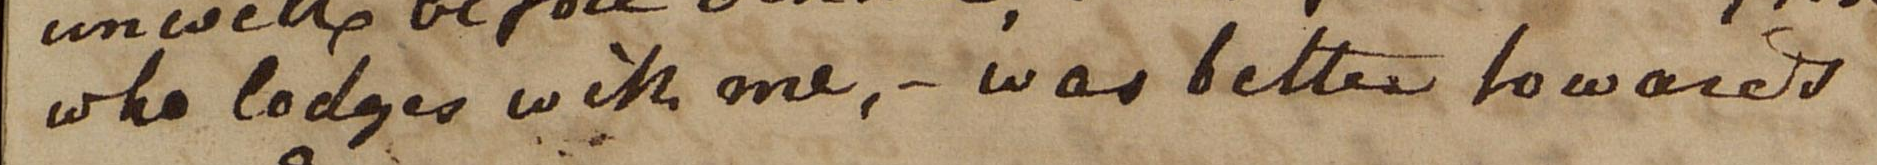who lodges with me,- was better towards
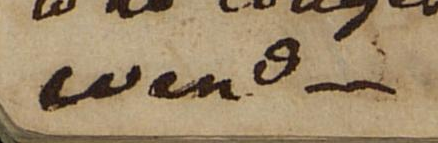even^g-
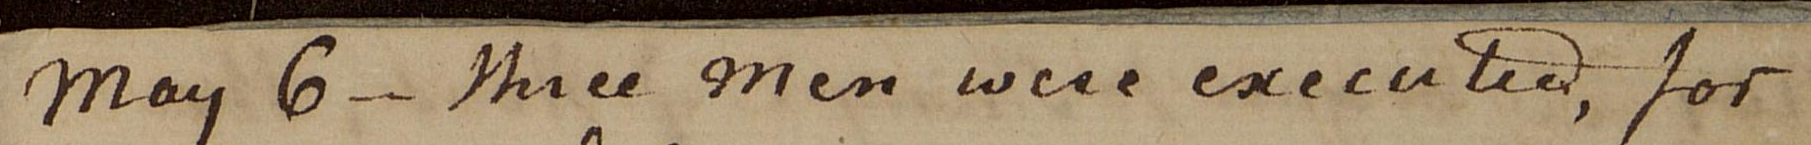May 6- three Men were executed, for
